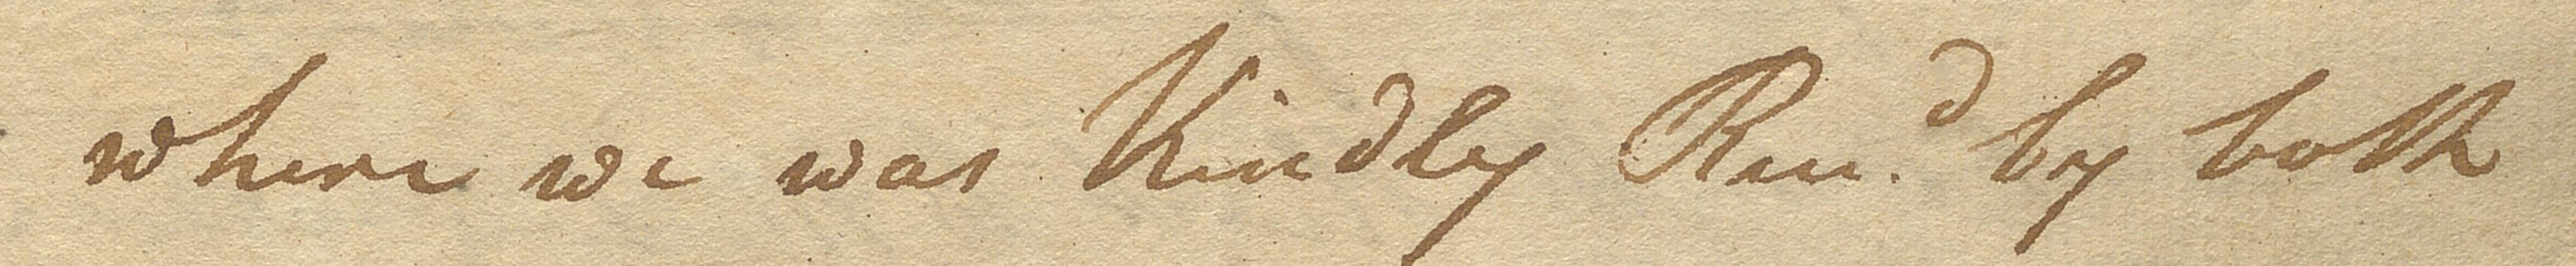where we was Kindly Rec^d. by both
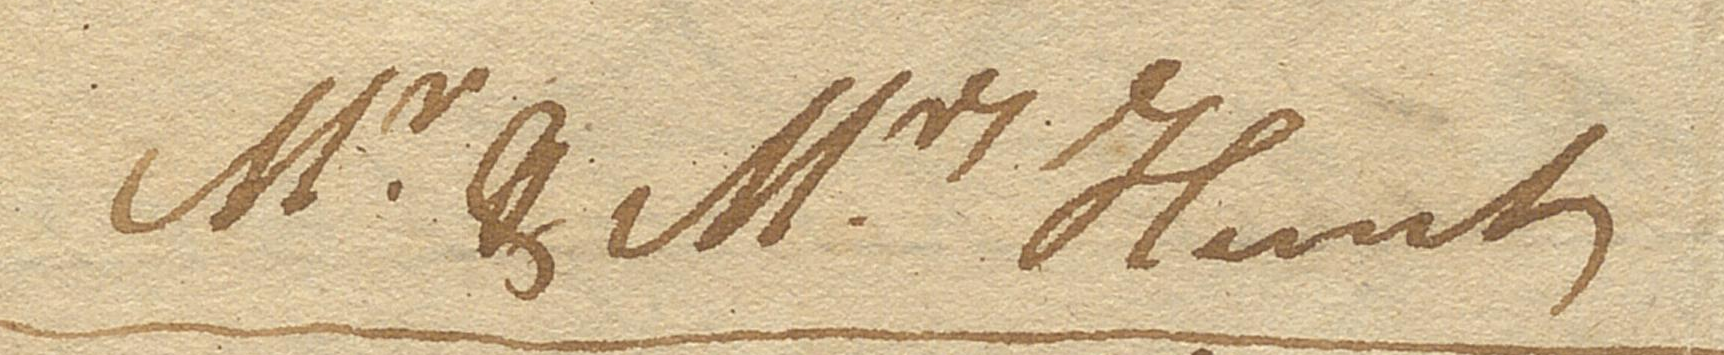M^r. & M^rs. Hunt
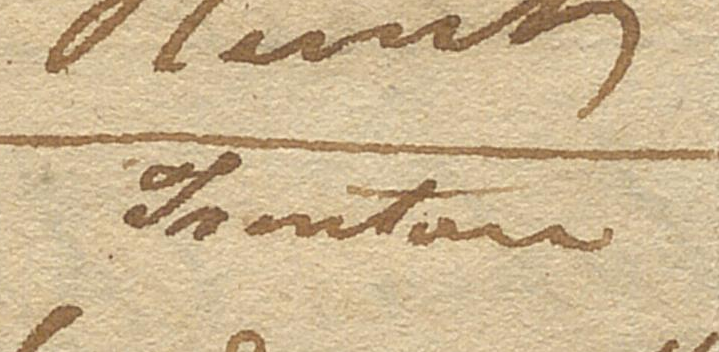Trenton
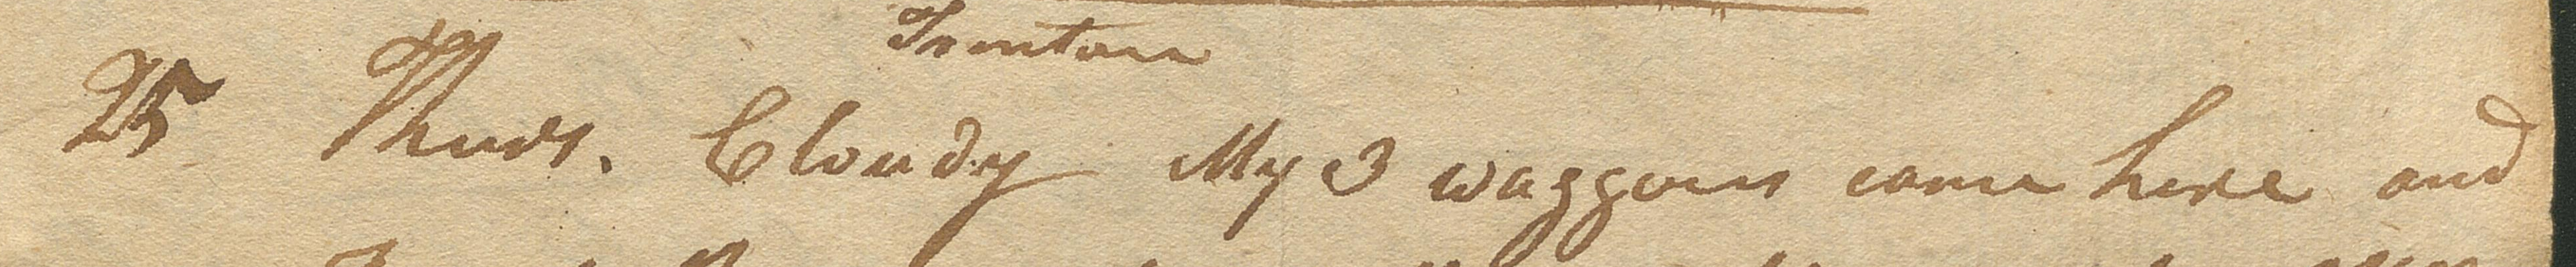25 Thurs. Cloudy My 3 waggons came here and
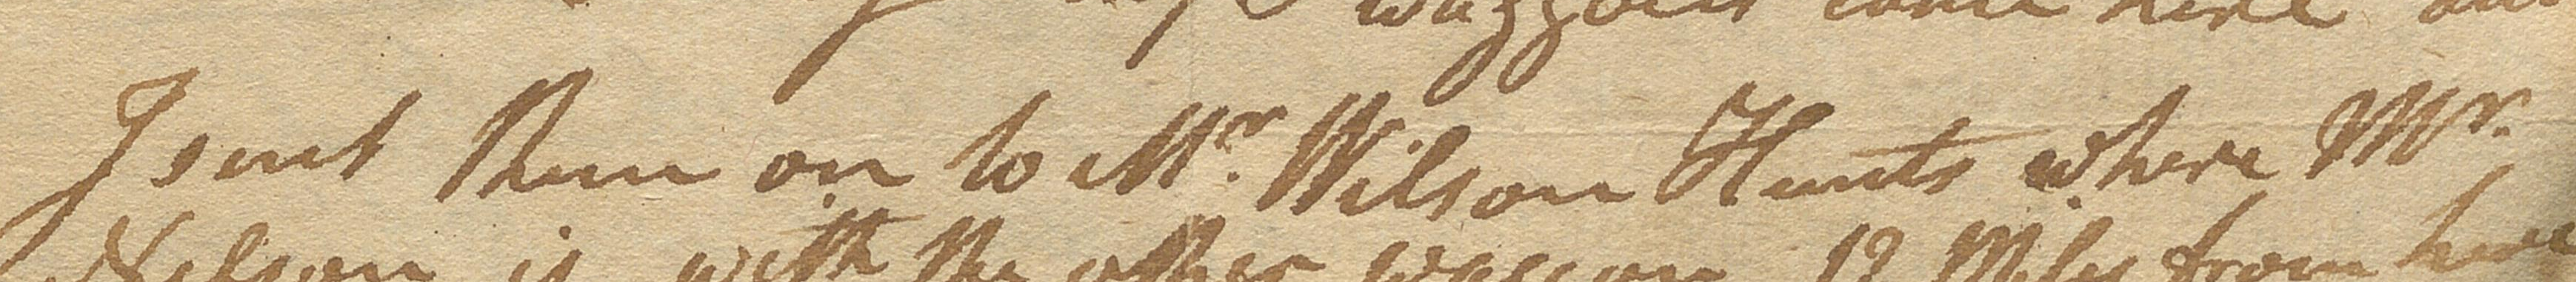I sent them on to M^r. Wilson Hunts where M^r.
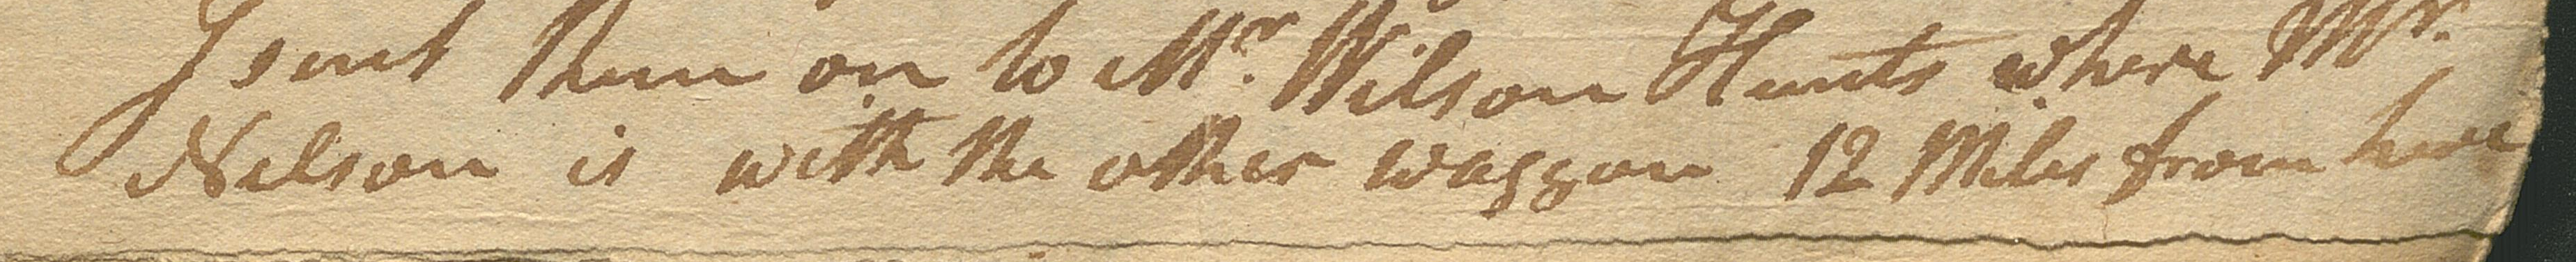Nelson is with the other waggon 12 Miles from here
